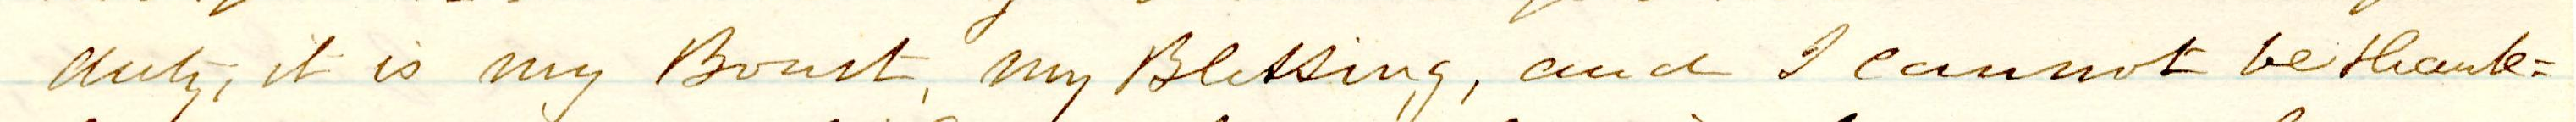duty, it is my Boost, my Blessing, and I cannot be thank-
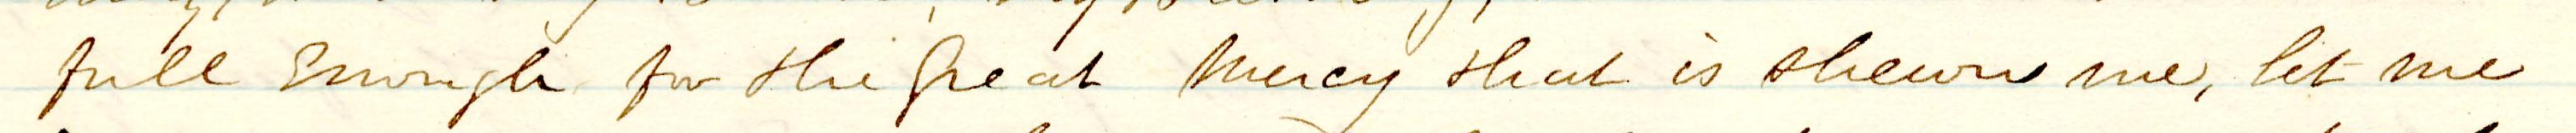full enough, for the great Mercy that is shewn me, let me
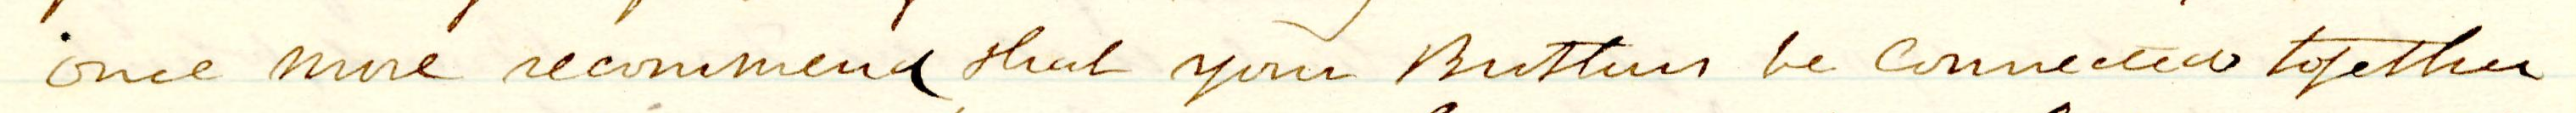once more recommend that your brothers be connected together
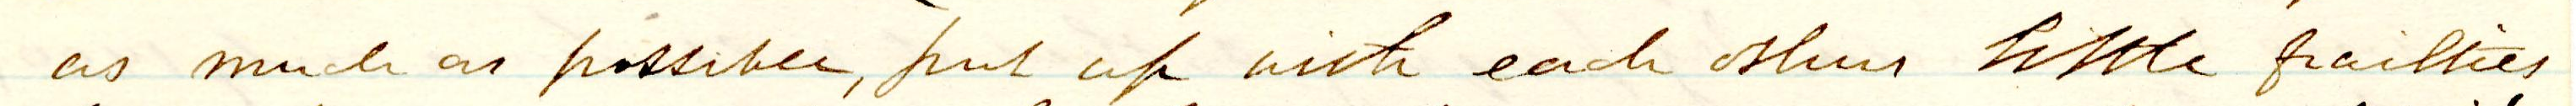as much as possible, put up with each others little frailties
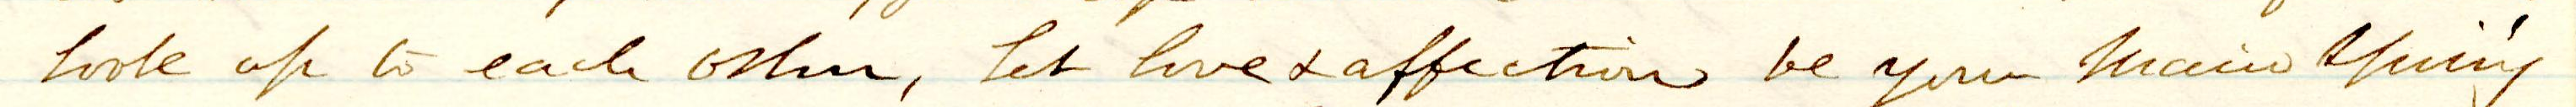look up to each other, let live & affection be your main spring
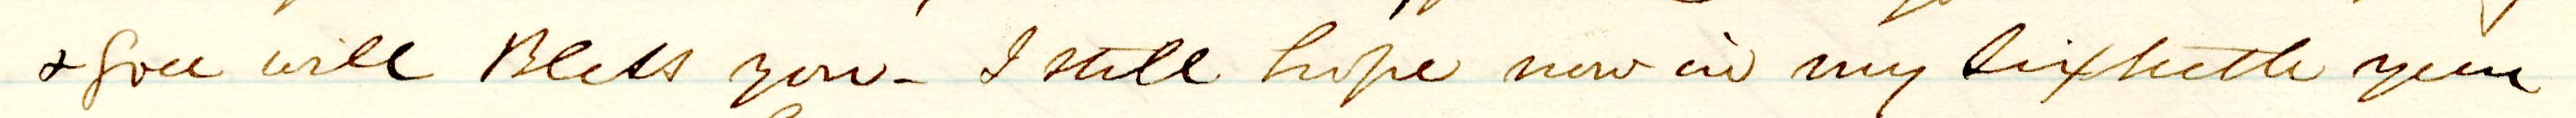& God will Bless you- I shall hope now in my sixtieth year
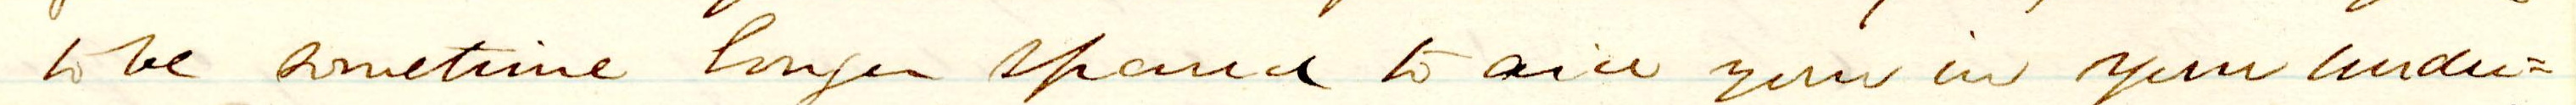to be sometime longer spared to aid you in your under-
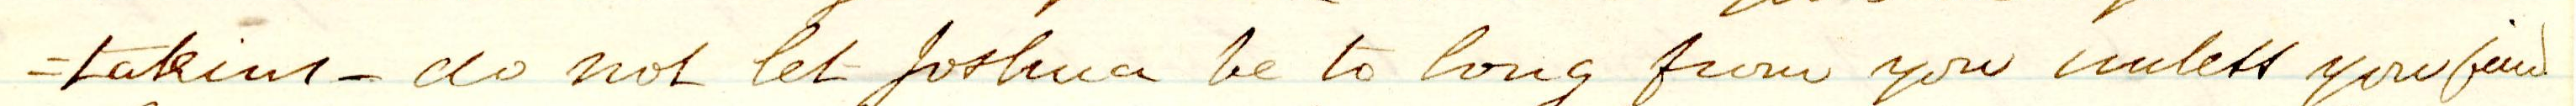-takings- Do not let Joshua be to long from you unless you find
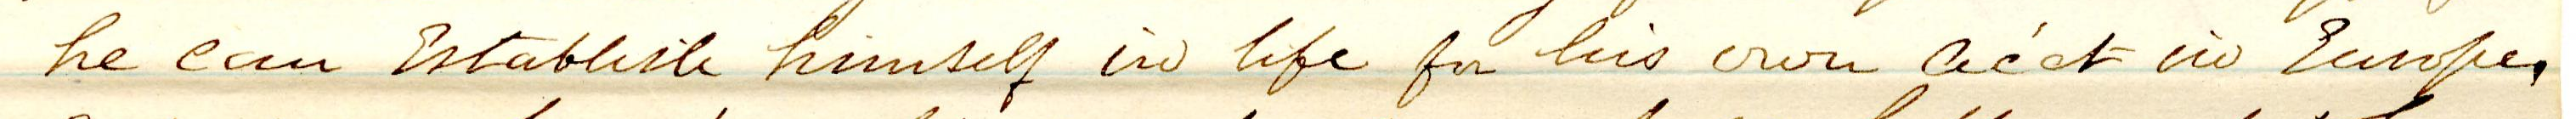he can Establish himself in life for his own acct in Europe,
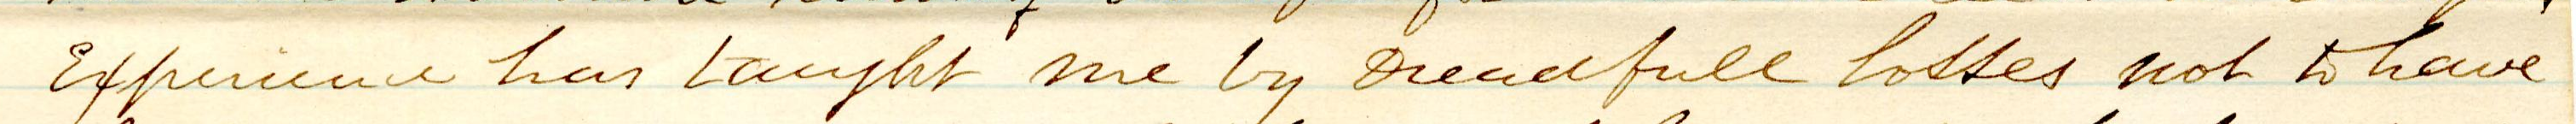Experience has taught me by Dreadfull losses not to have
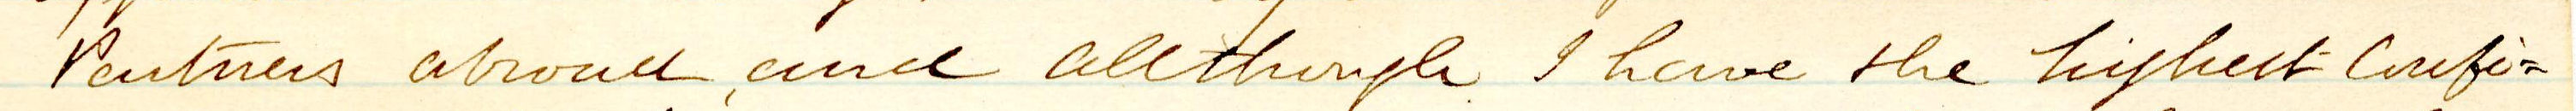Partners about and allthough I have the highest confi-
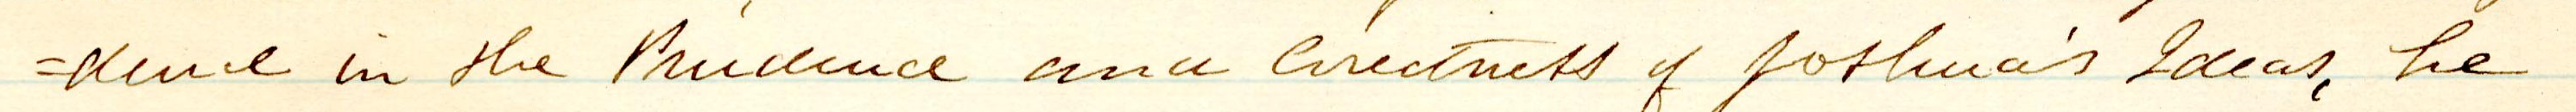-dence in the prudence and correctness of for Joshua's Ideas, he
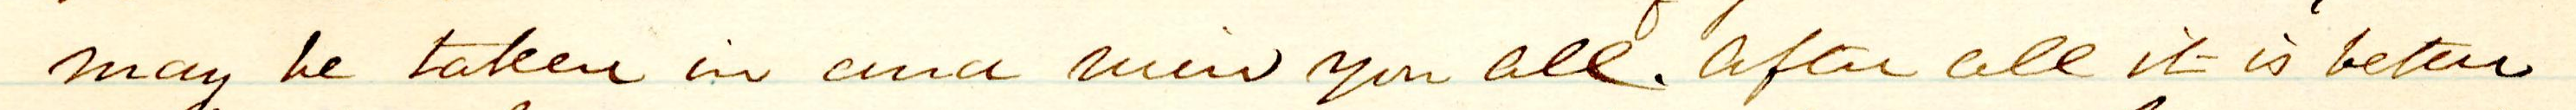may be taken in and ruin you all. After all it is better
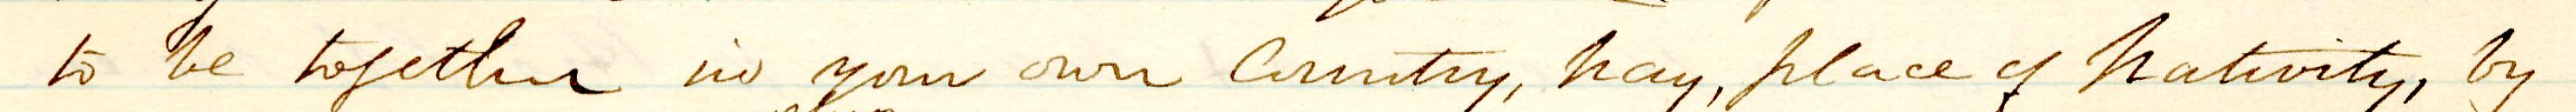to be together in your own country, nay, place of nativity, by
